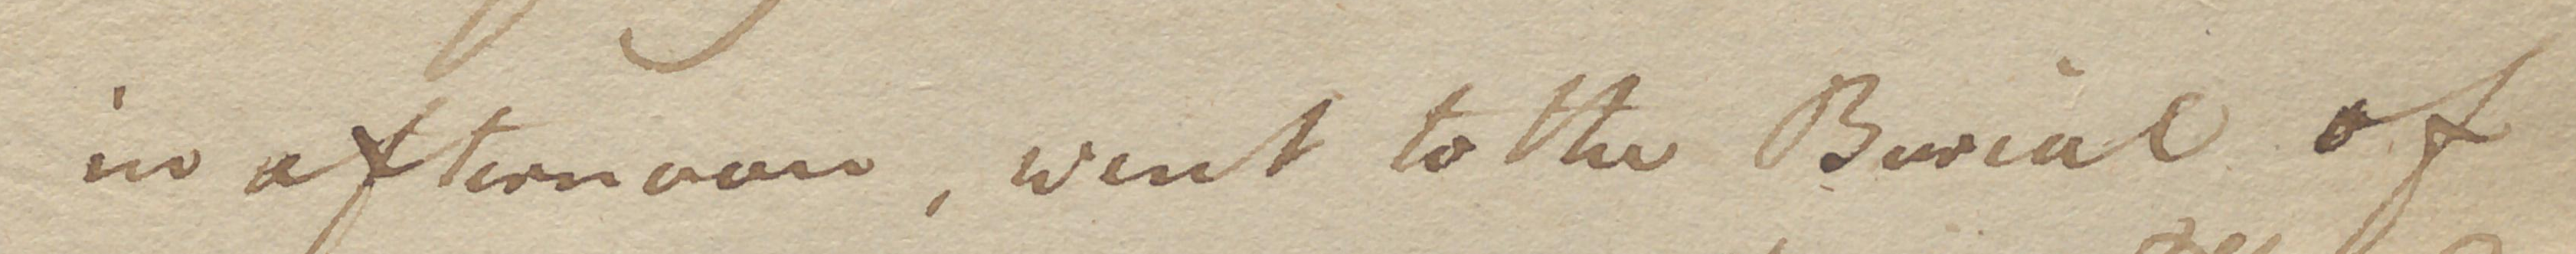in afternoon, went to the Burial of
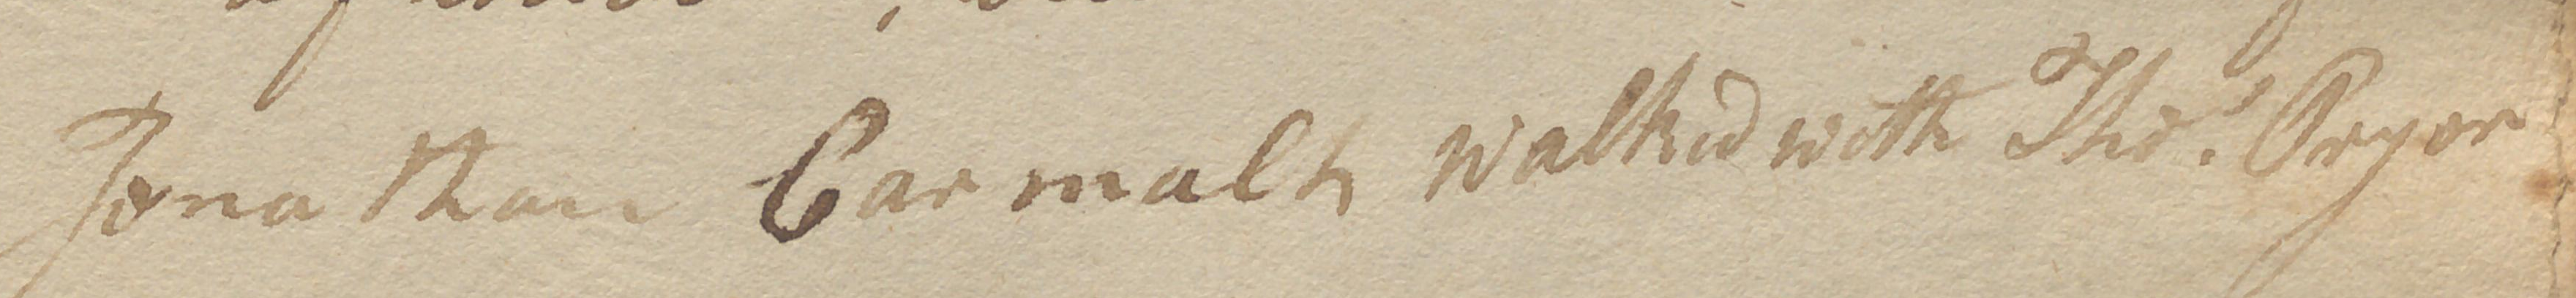tonathar Carmalt walked with Tho^s. Pryor
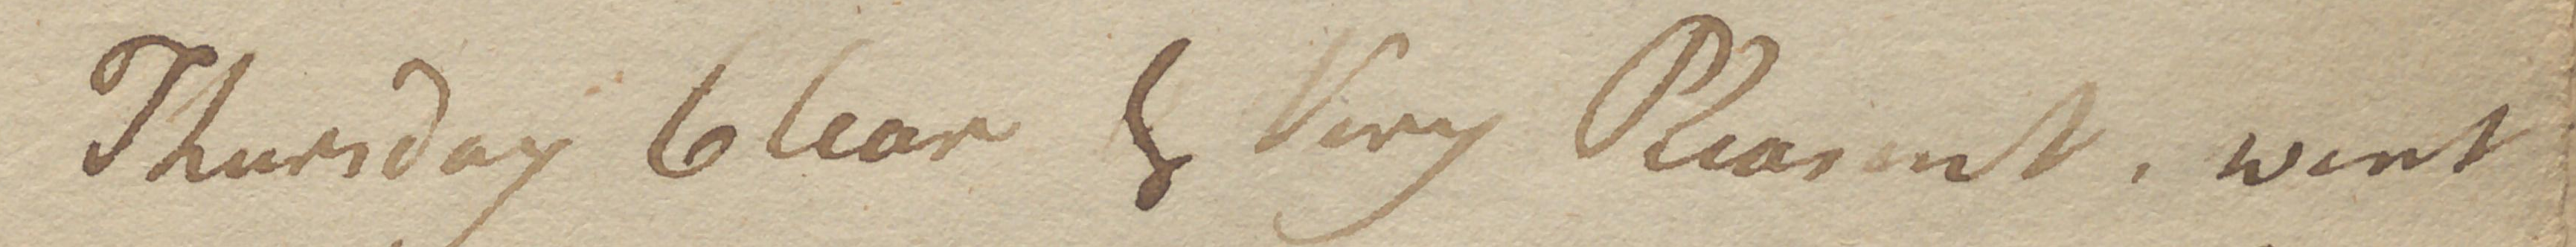Thursday Clear Very Pleasent, went
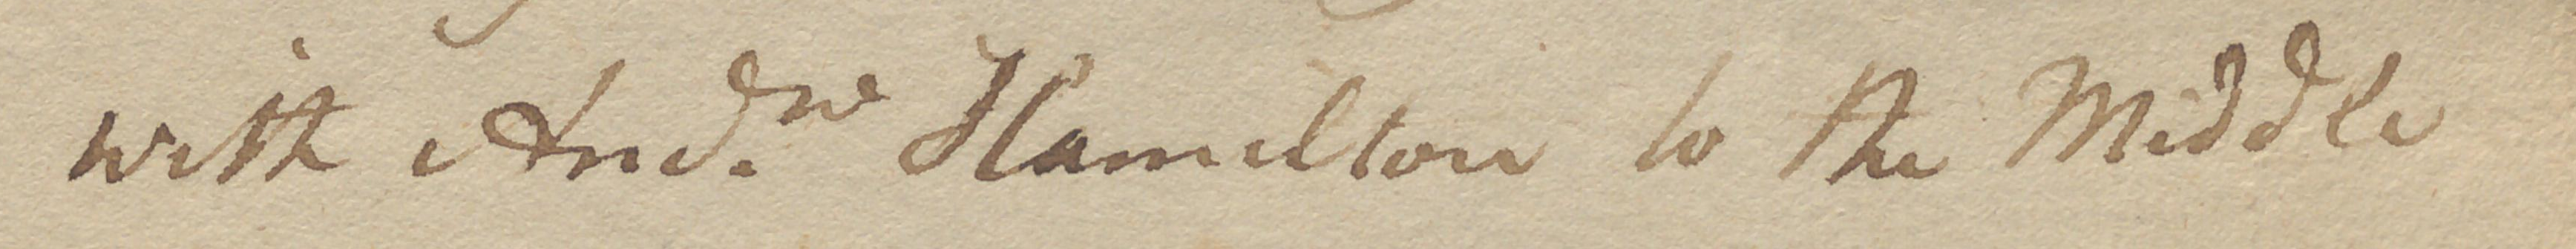with And^w. Hamilton to the Middle
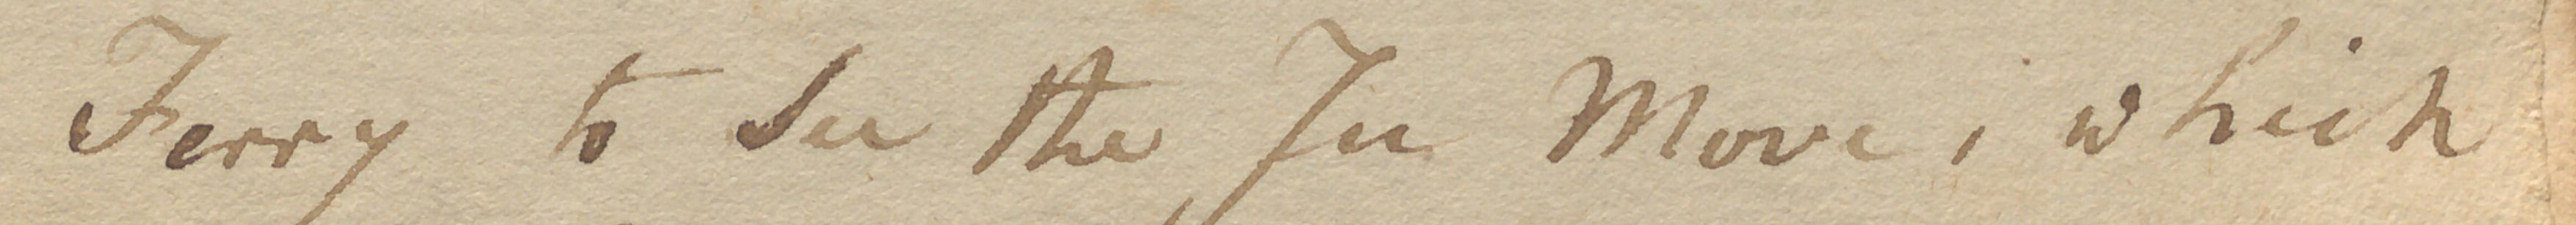Ferry to see the Ice Move, which
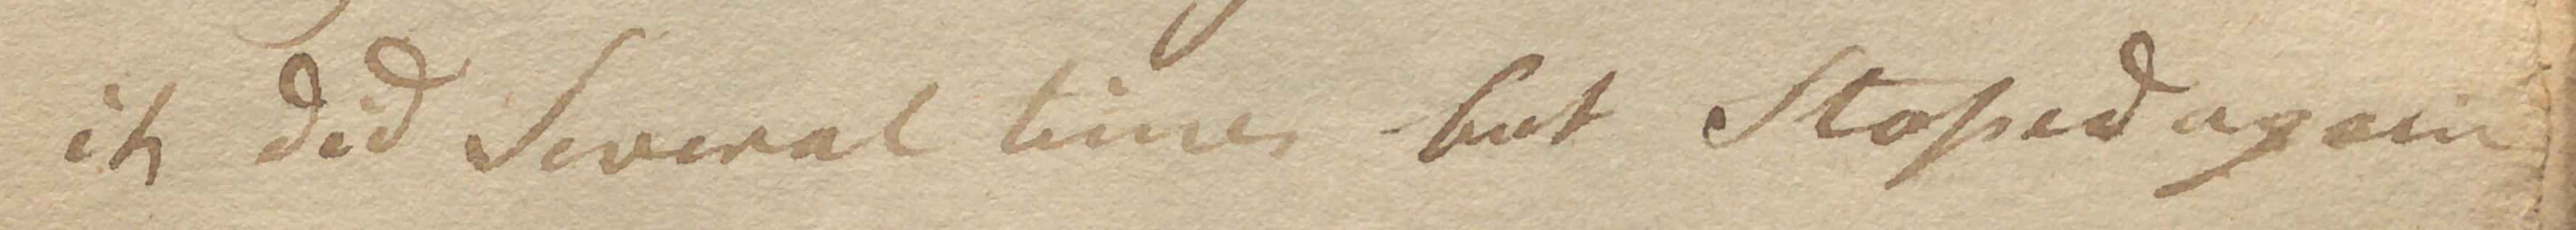it did Several times but Stoped again
